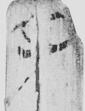娩（俛）
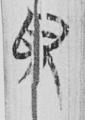視
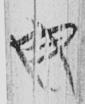母
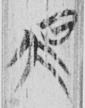○（側）
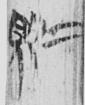○（眱）
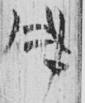凡
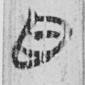目
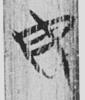母
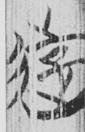遊
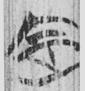定（正）
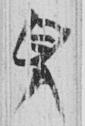視
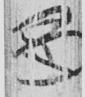是
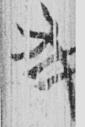求
